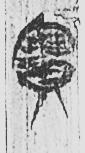賽
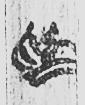爲
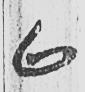㠯（以）
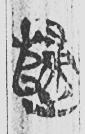歸
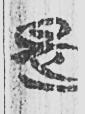是
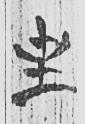生
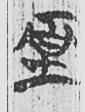{卜？土}
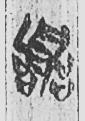囂
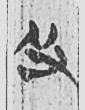及
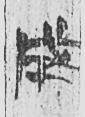成
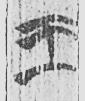王
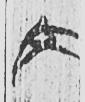文
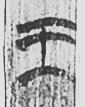王
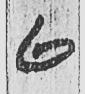㠯（以）
